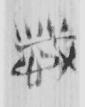慼
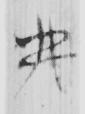弗
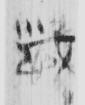慼
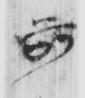可
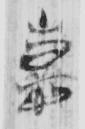𢝫
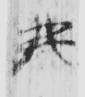弗
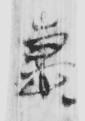𢝫
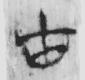古
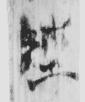{阜朮土}
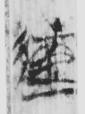{止達}
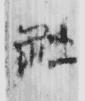社
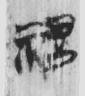禝
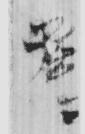孫
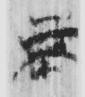不
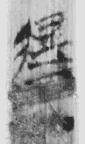逗
